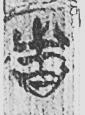周
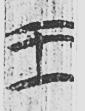王
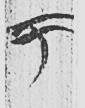于
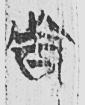周
